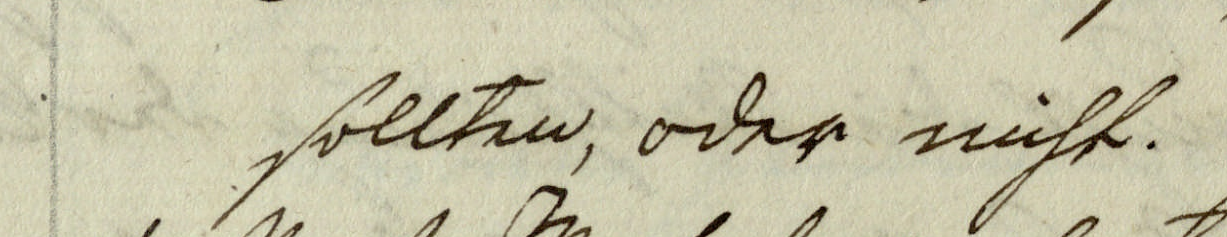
sollten, oder nicht.
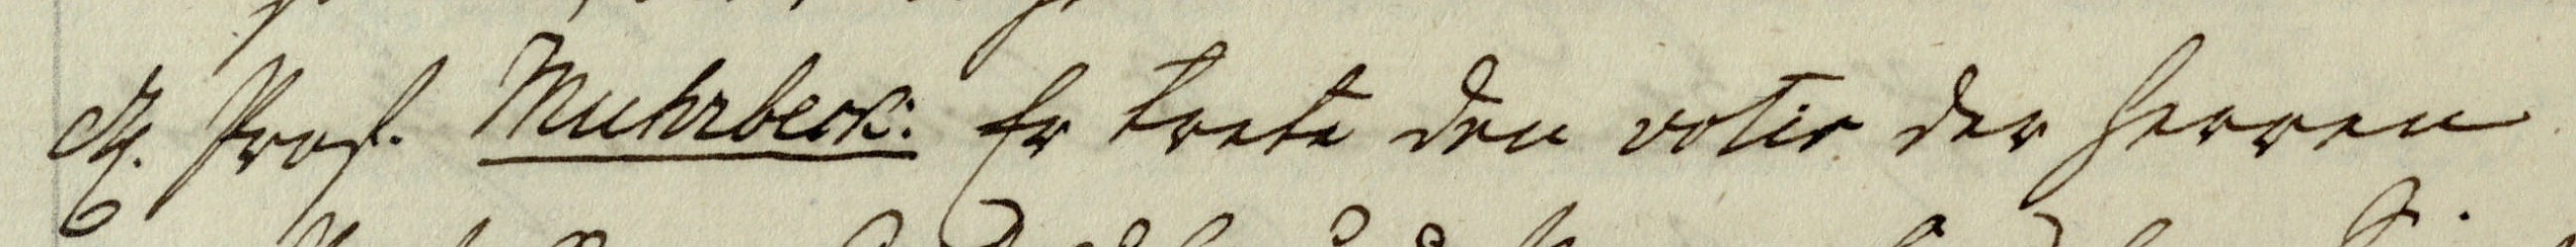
dh. Prof. Muhrbeck: Er trete den votis der Herren
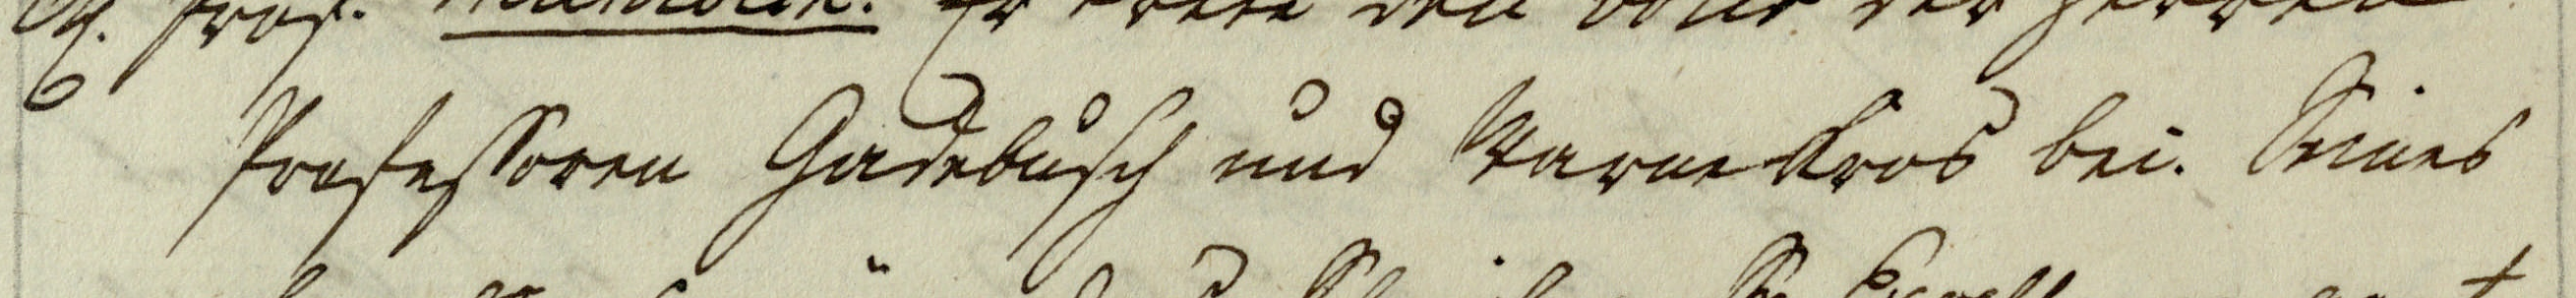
Professoren gadebusch und Warneckros bei. Seines
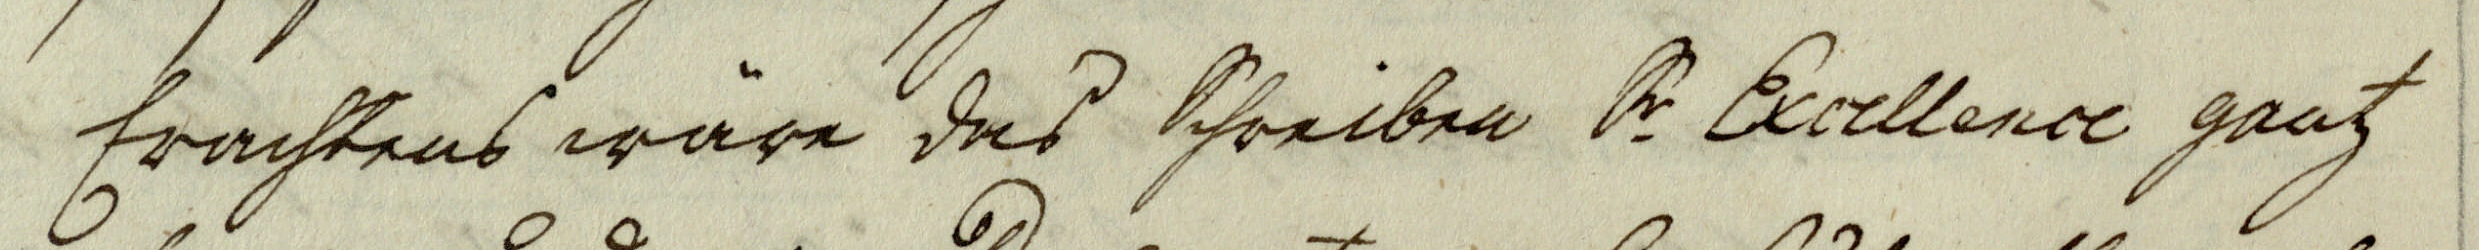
Erachtens wäre das Schreiben Sr. Excellence gantz
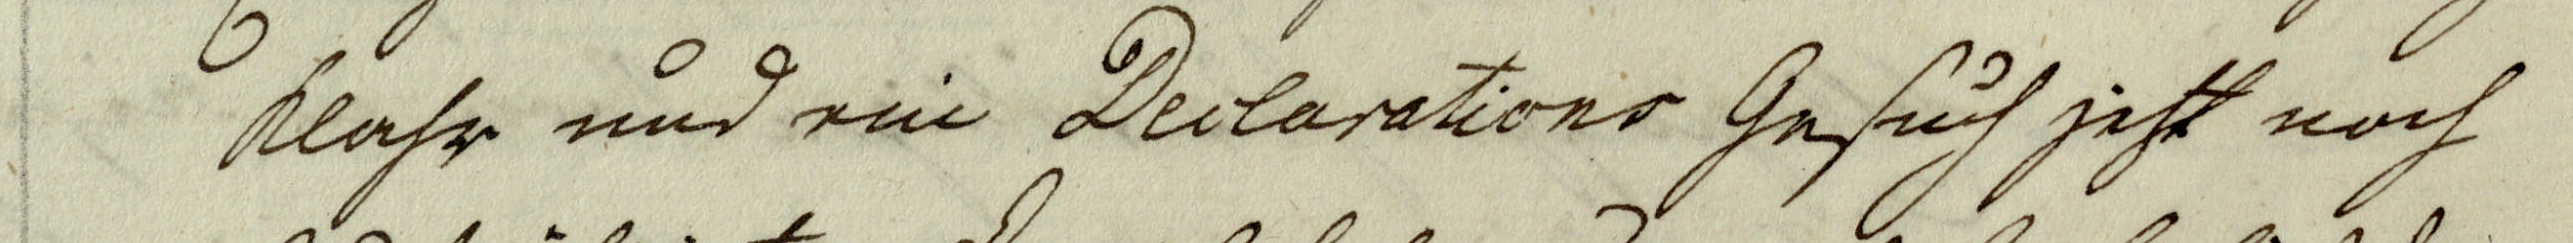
klahr und ein Declarations Gesuch jetzt noch
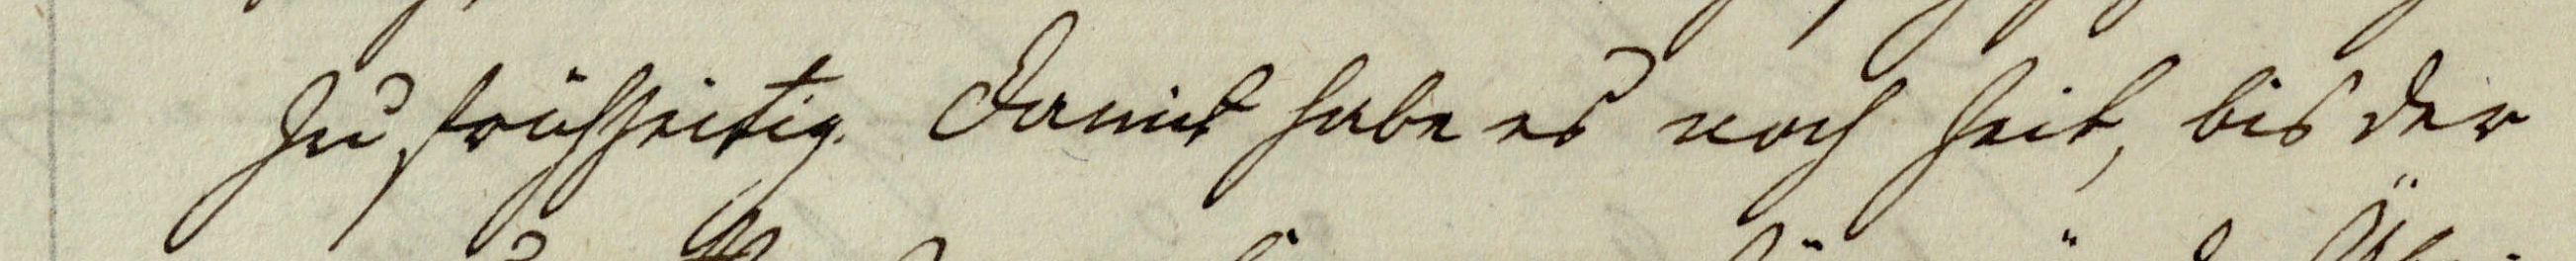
zu frühzeitig. Damit habe es noch zeit, bis der
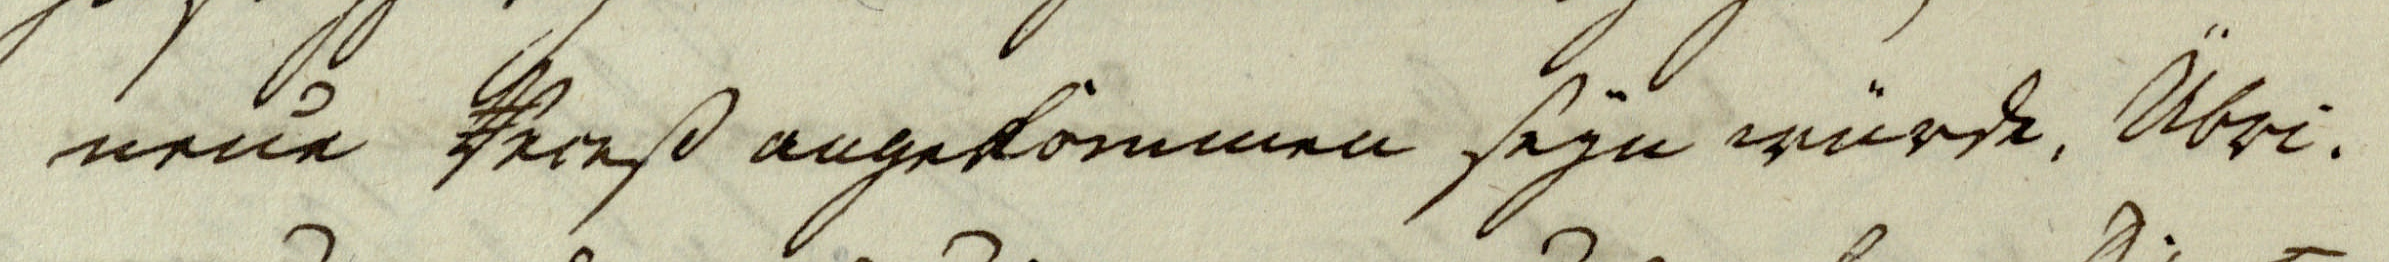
neue Receß angekommen seÿn würde. Übri¬
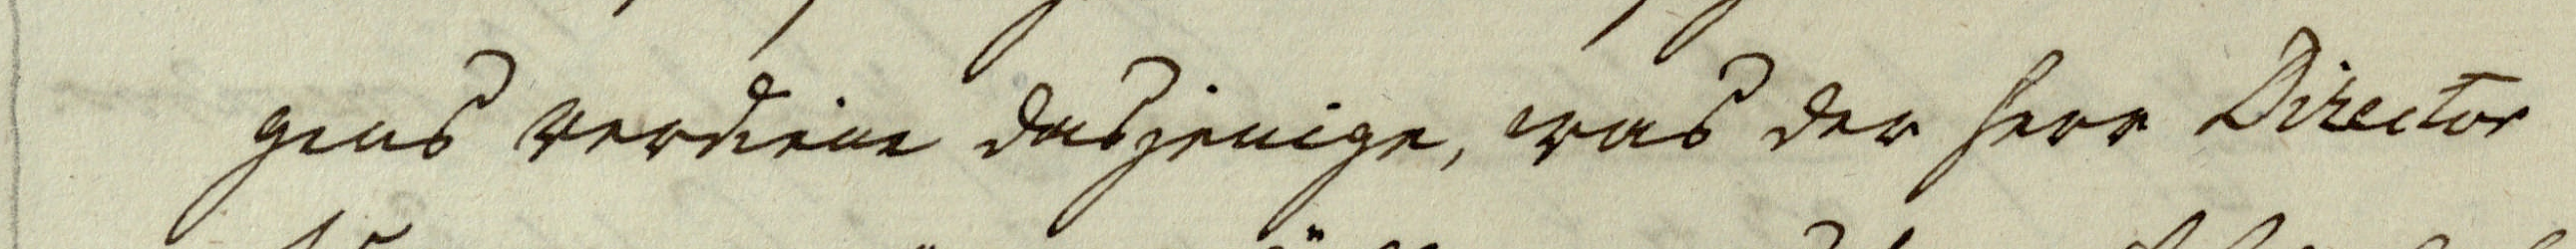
gens verdiene dasjenige, was der Herr Director
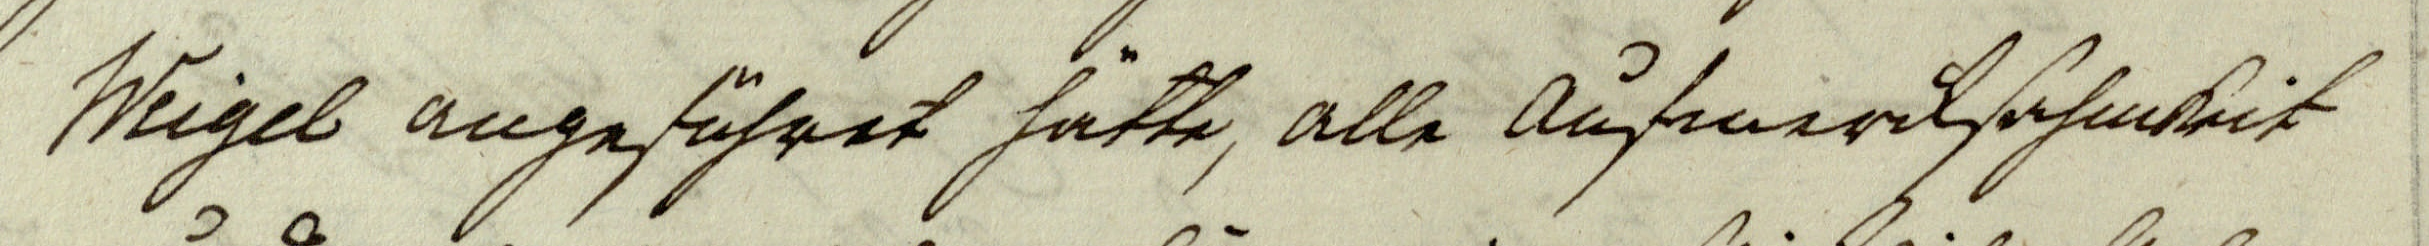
Weigel angeführt hätte, alle Aufmerksamkeit
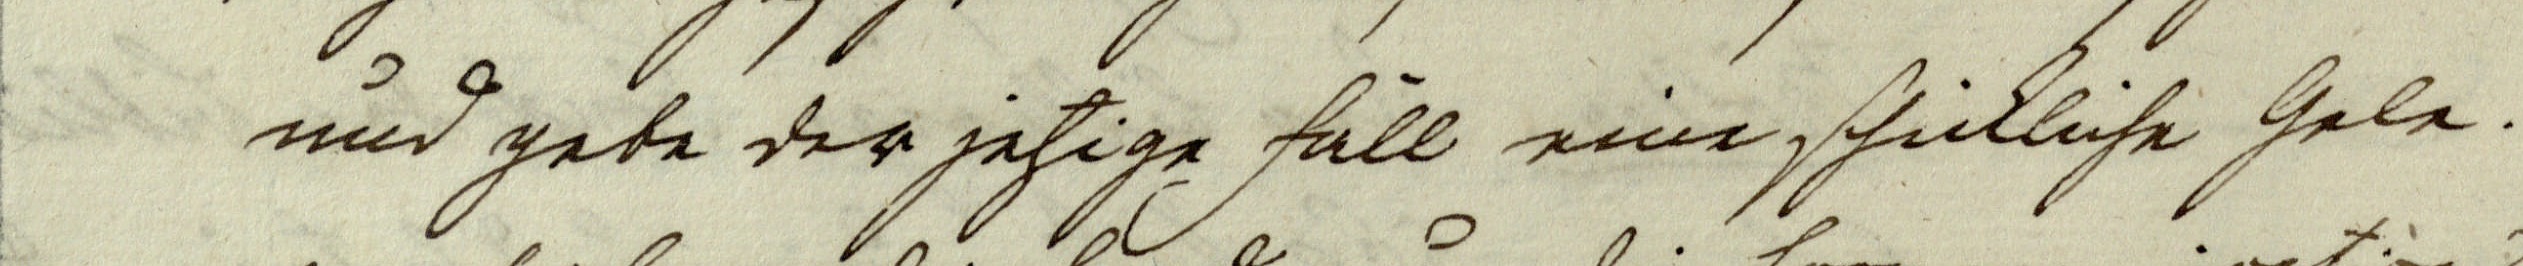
und gebe der jetzige Fall eine schickliche Gele¬
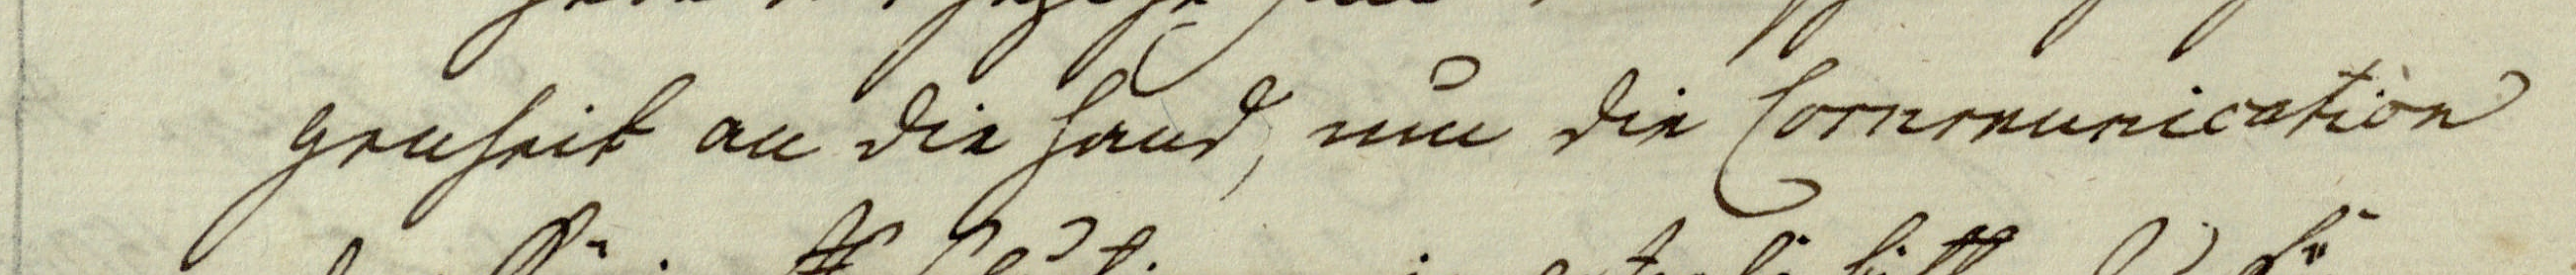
genheit an die Hand, um die Communication
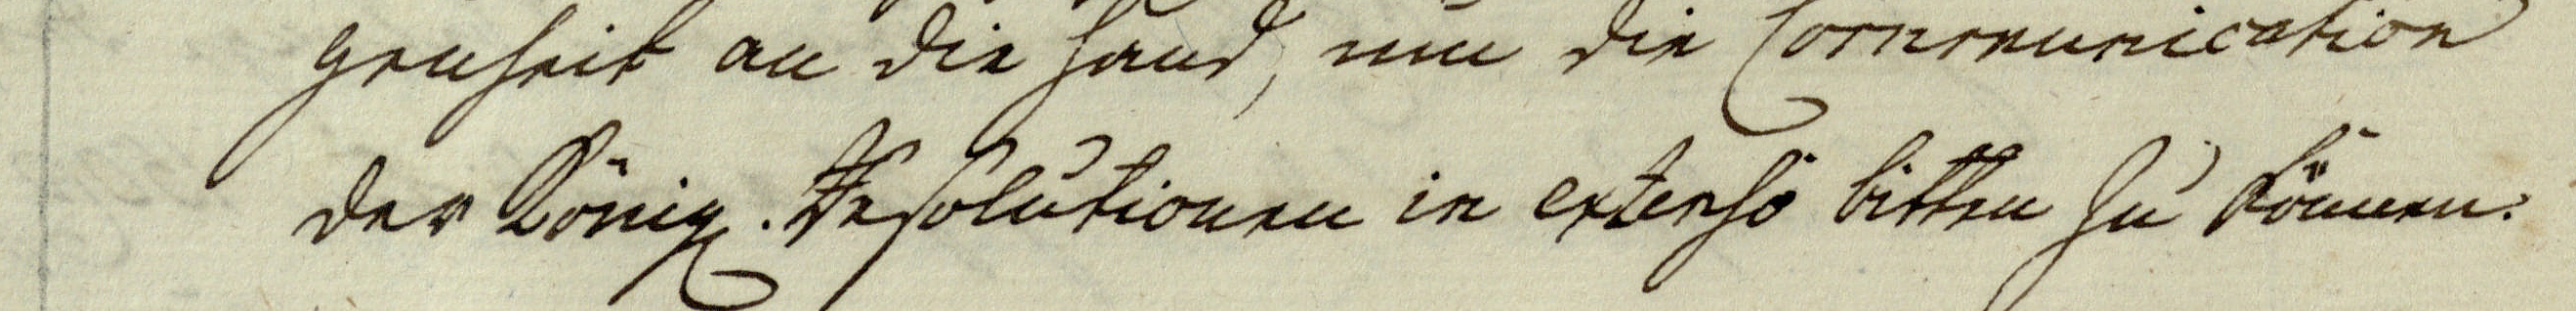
der Königl. Resolutionen in extenso bitten zu können.
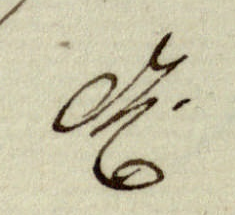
dh.
